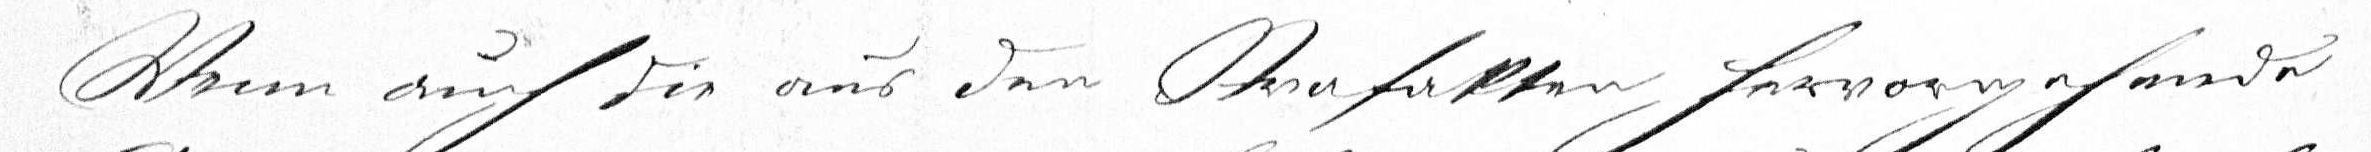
Wenn auch die aus den Strafakten Hervorgehende
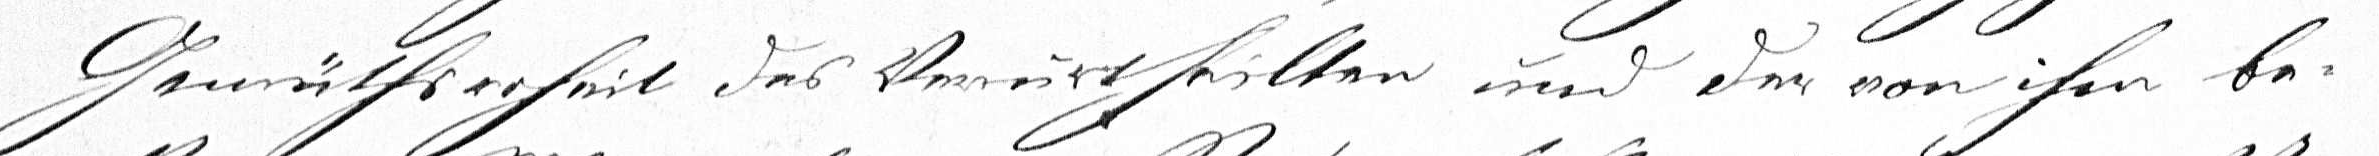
Gemüthsroheit des Verurtheilten und der ihm be¬
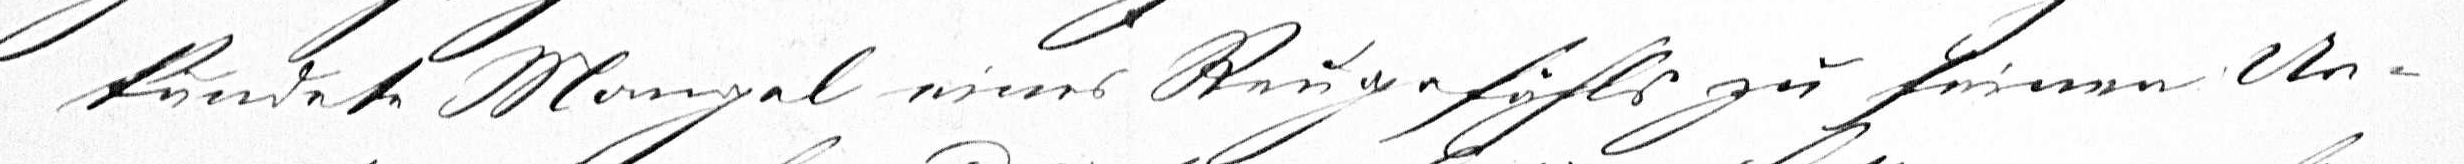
kundete Mangel eines Reugefühls zu seinen Un¬
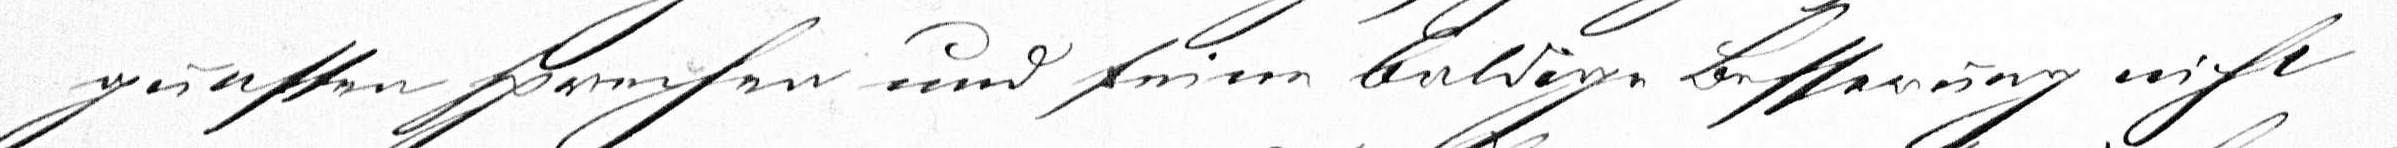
gunsten sprechen und seine baldige Besserung nicht
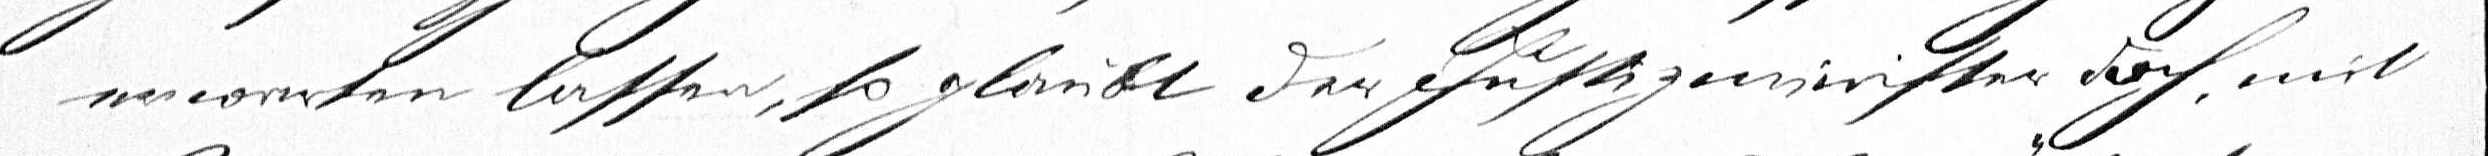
erwerten lassen, so glaubt der Justizminister doch, mit
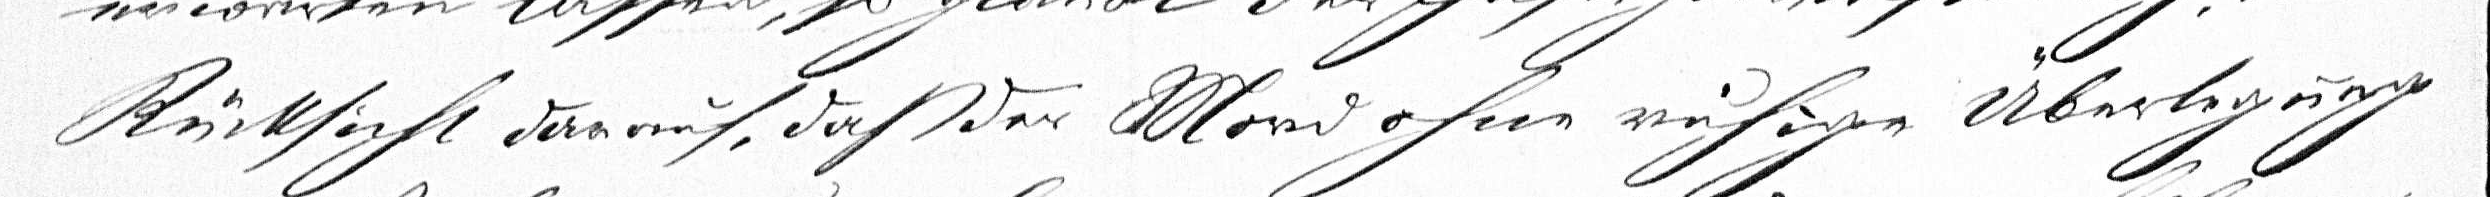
Rücksicht darauf daß der Mord ohne ruhige Überlegung
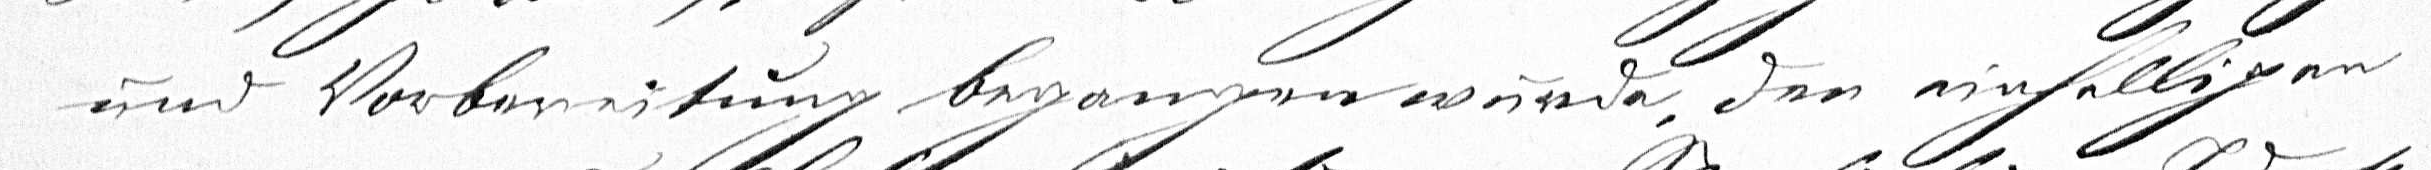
und Vorbereitung begangen wurde, den einhelligen
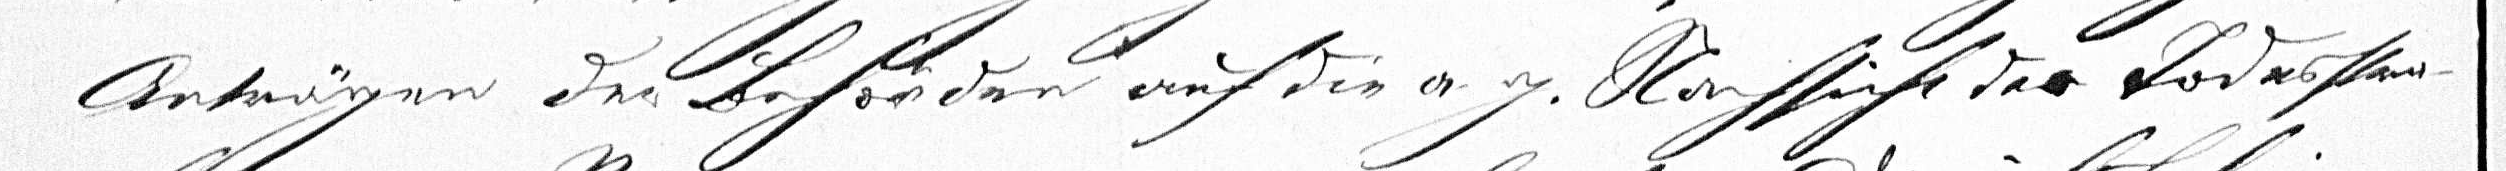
Anträgen der Behörden auf die a. g. Nachsicht der Todesstra¬
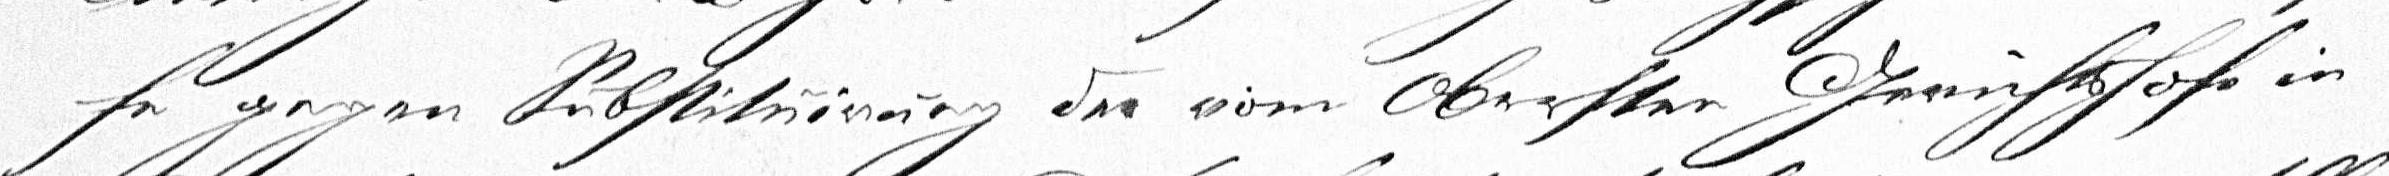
fe gegen Substituirung der vom Obersten Gerichtshof in
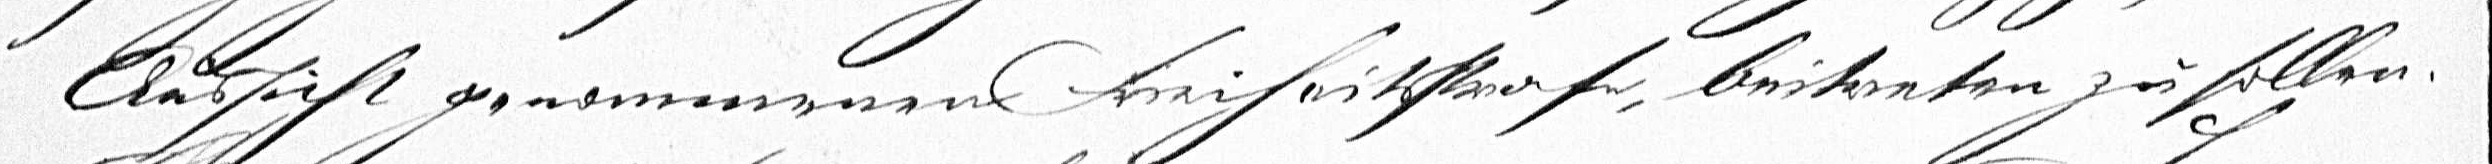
Aussicht genommenen Freiheitsstrafe, beitreten zu sollen.
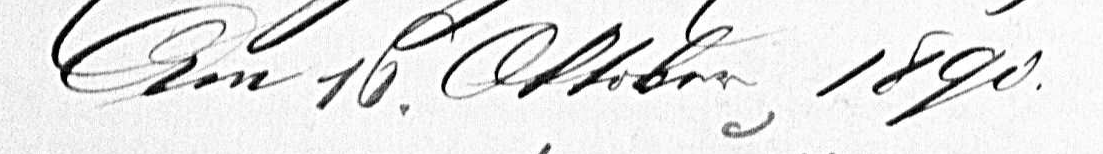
Am 16. Oktober 1890.
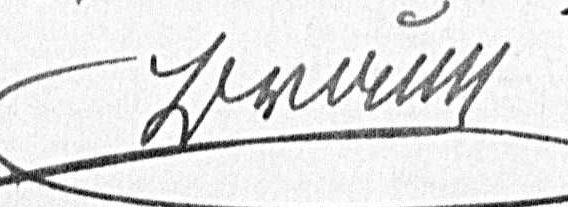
Braun
